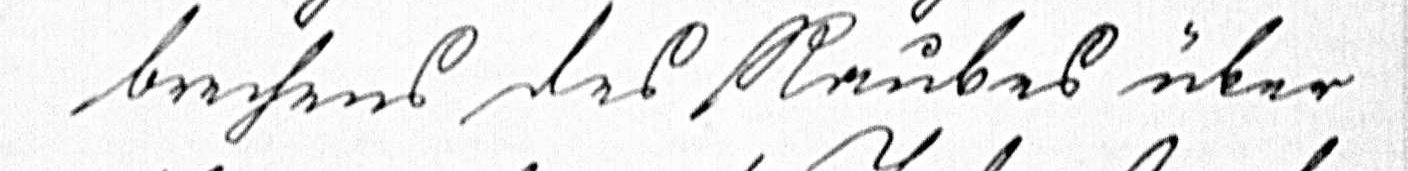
brechens des Raubes über
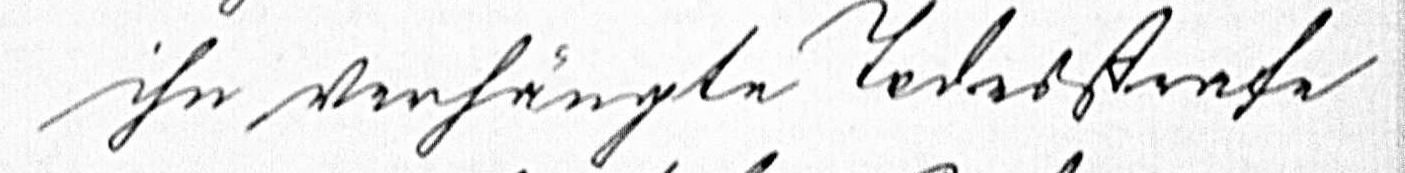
ihn verhängte Todestrafe
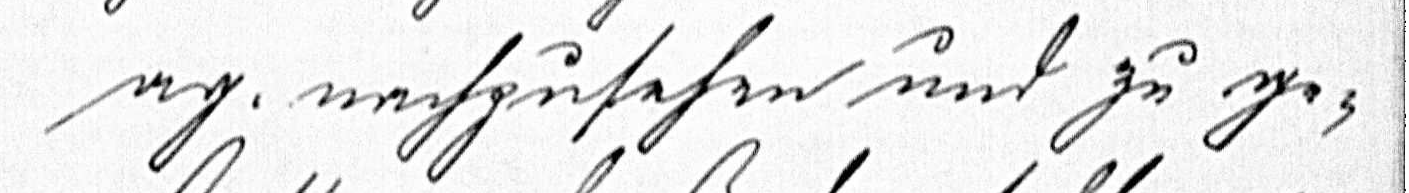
ag. nachzusehen und zu ge¬
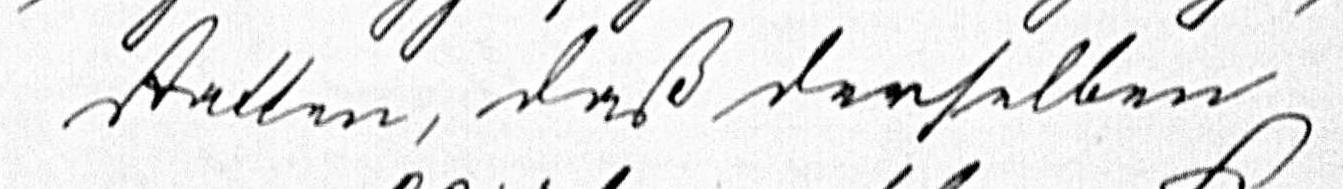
statten, daß derselben
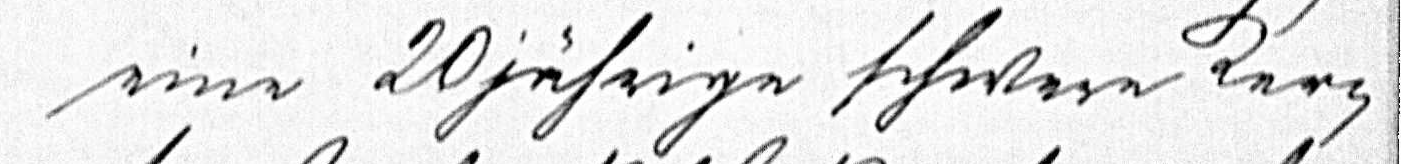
eine 20jährige schweren Ker¬
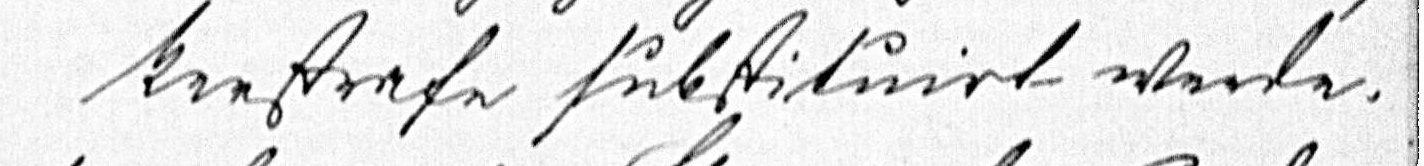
kerstrafe substituirt werde.
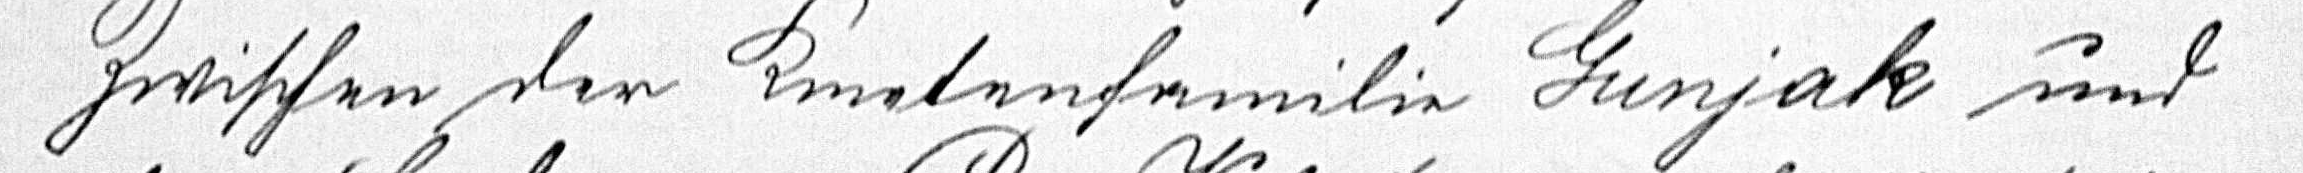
Zwischen der Kmetenfamilie Gunjak und
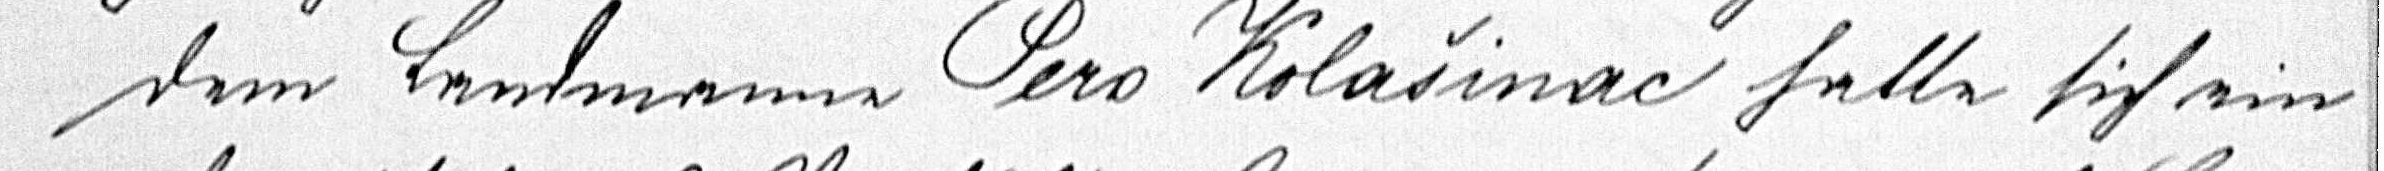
dem Landmann Pero Kolašinac hatte sich ein
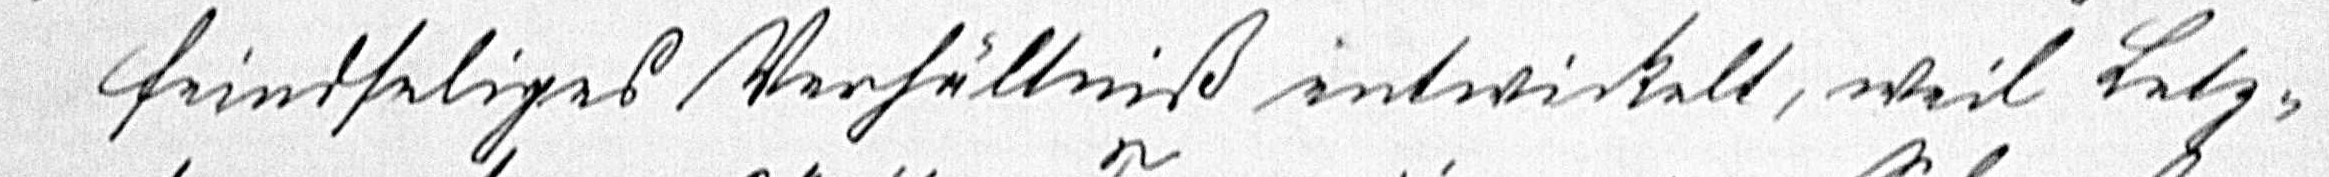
Feindseliges Verhältniß entwickelt, weil Letz¬
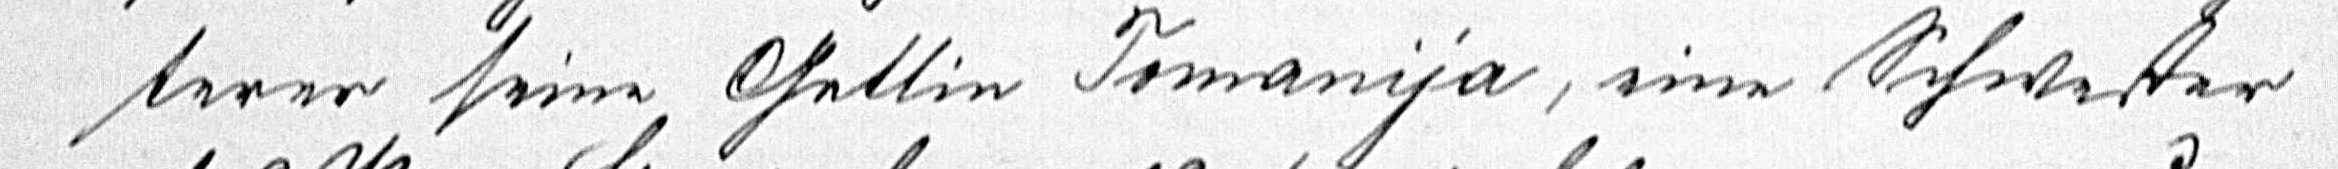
terer seine Gattin Tomanija, eine Schwester
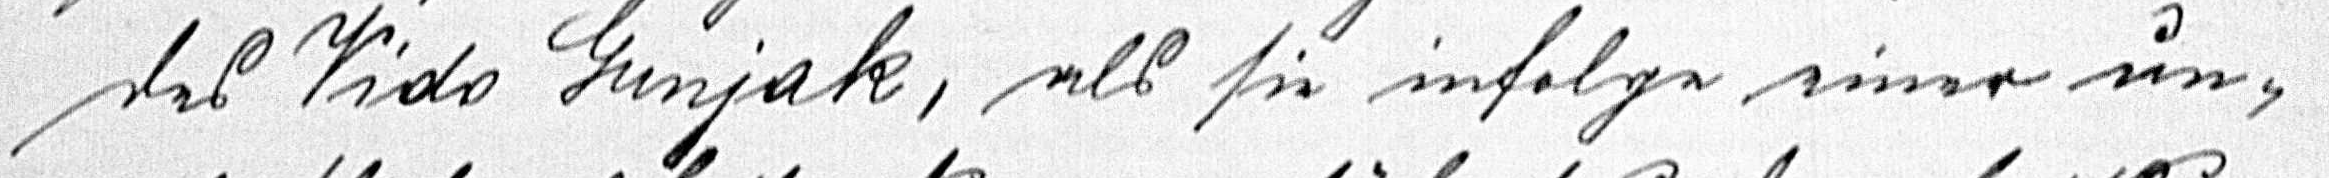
des Vido Gunjak, als sie infolge einer un¬
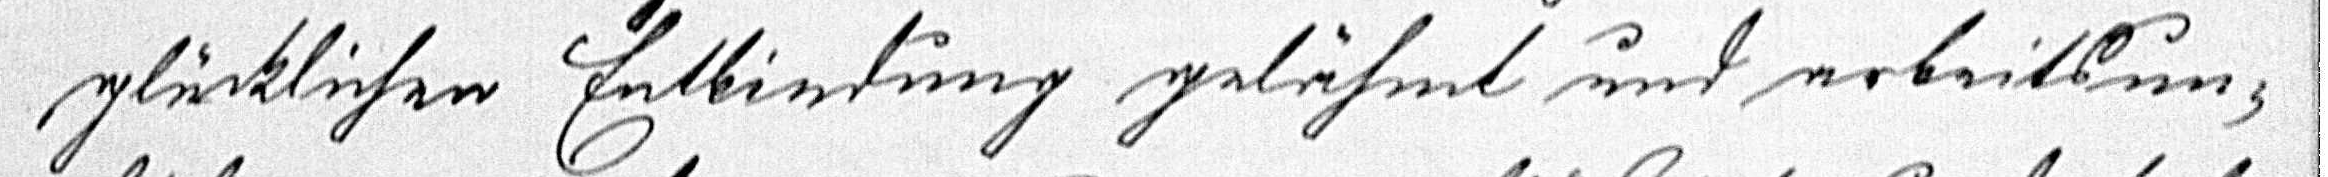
glücklichen Entbindung gelähmt und arbeitsun¬
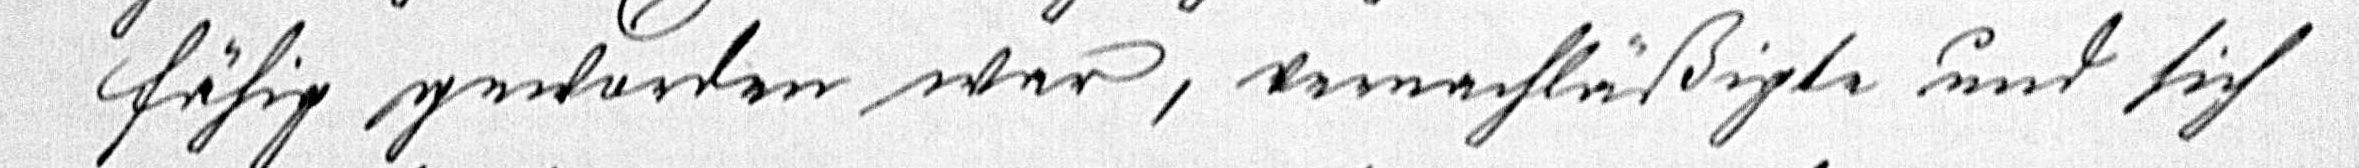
fähig geworden war, vernachläßigte und sich
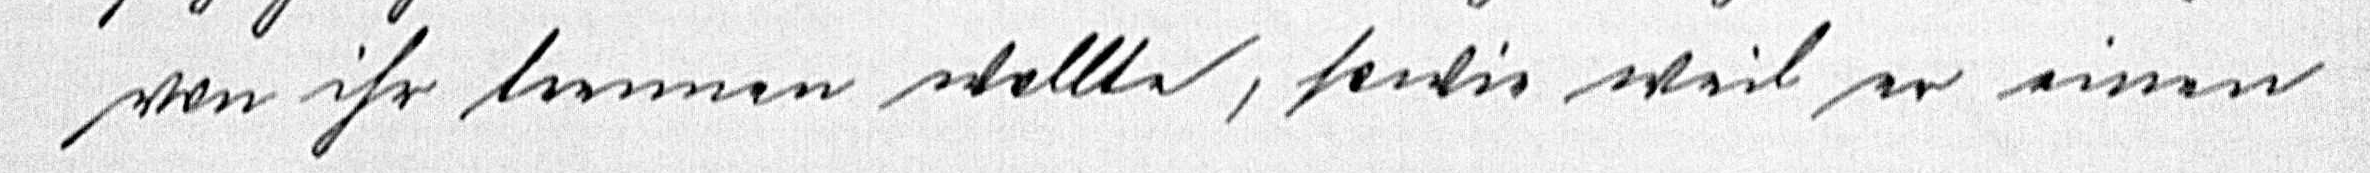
von ihr trennen wollte, sowie weil er einen
